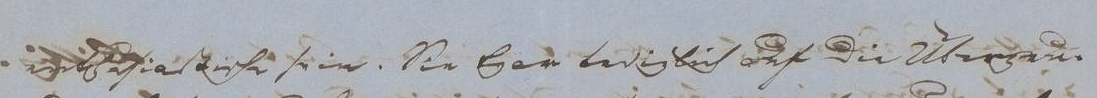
enthusiastische sein. Sie war lediglich auf die Überzeu-
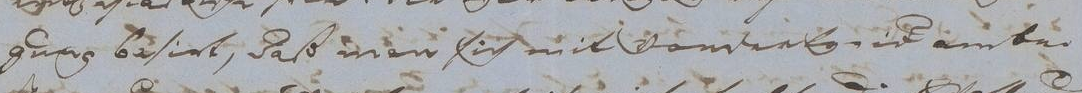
gung basirt, daß man sich mit Vonderweid am be-
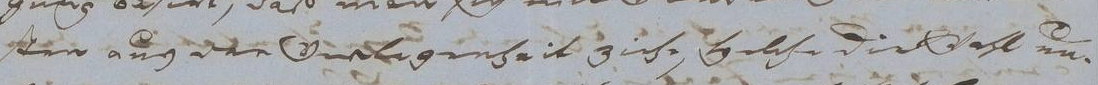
sten aus der Verlegenheit ziehe, welche die Wahl un-
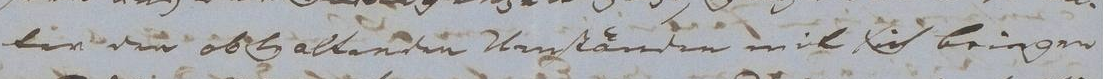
ter den obwaltenden Umständen mit sich bringen
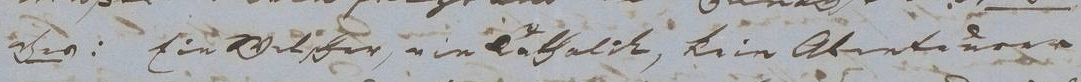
ches: Ein Welscher, ein Katholik, kein Abenteurer
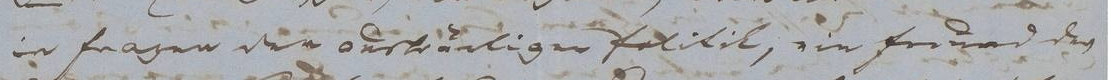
in Fragen der auswärtigen Politik, ein Freund des
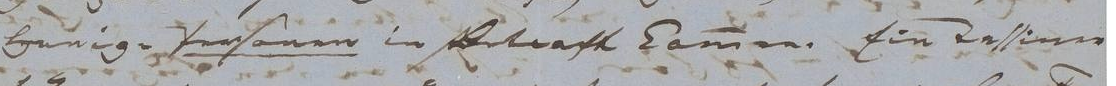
wenige Personen in Betracht kommen. Ein Tessiner
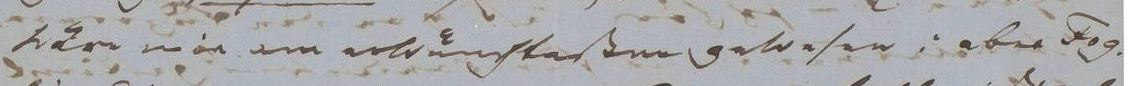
wäre mir am erwünschtesten gewesen: aber Fog-
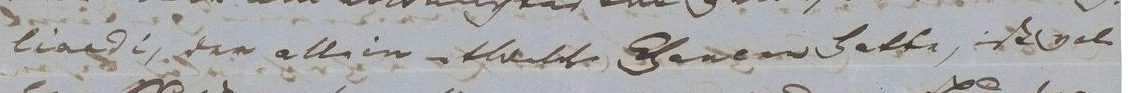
liardi, der allein etwelche Chancen hatte, ist vol-
